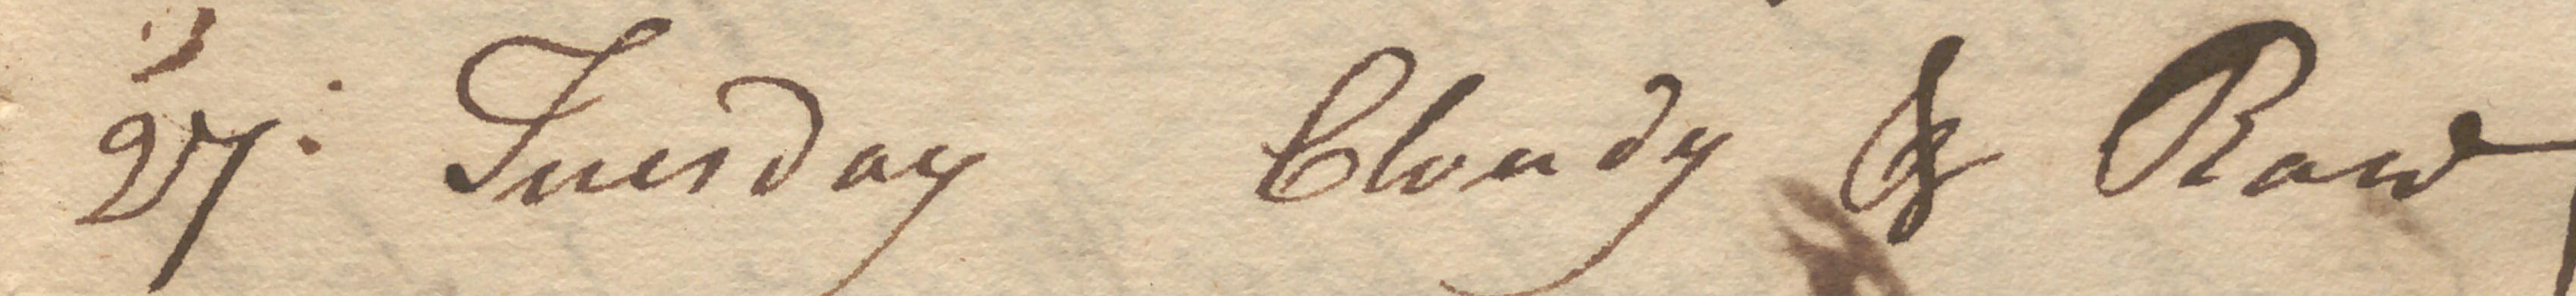27 Tuesday Cloudy & Raw
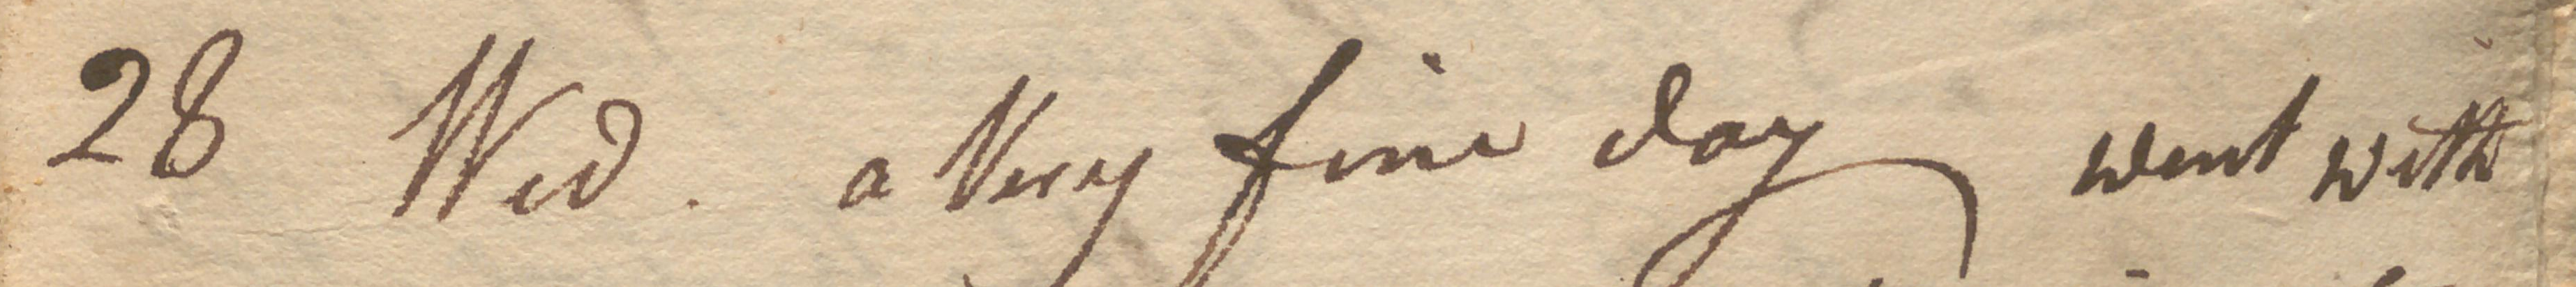28 Wed. a Very fine day went with
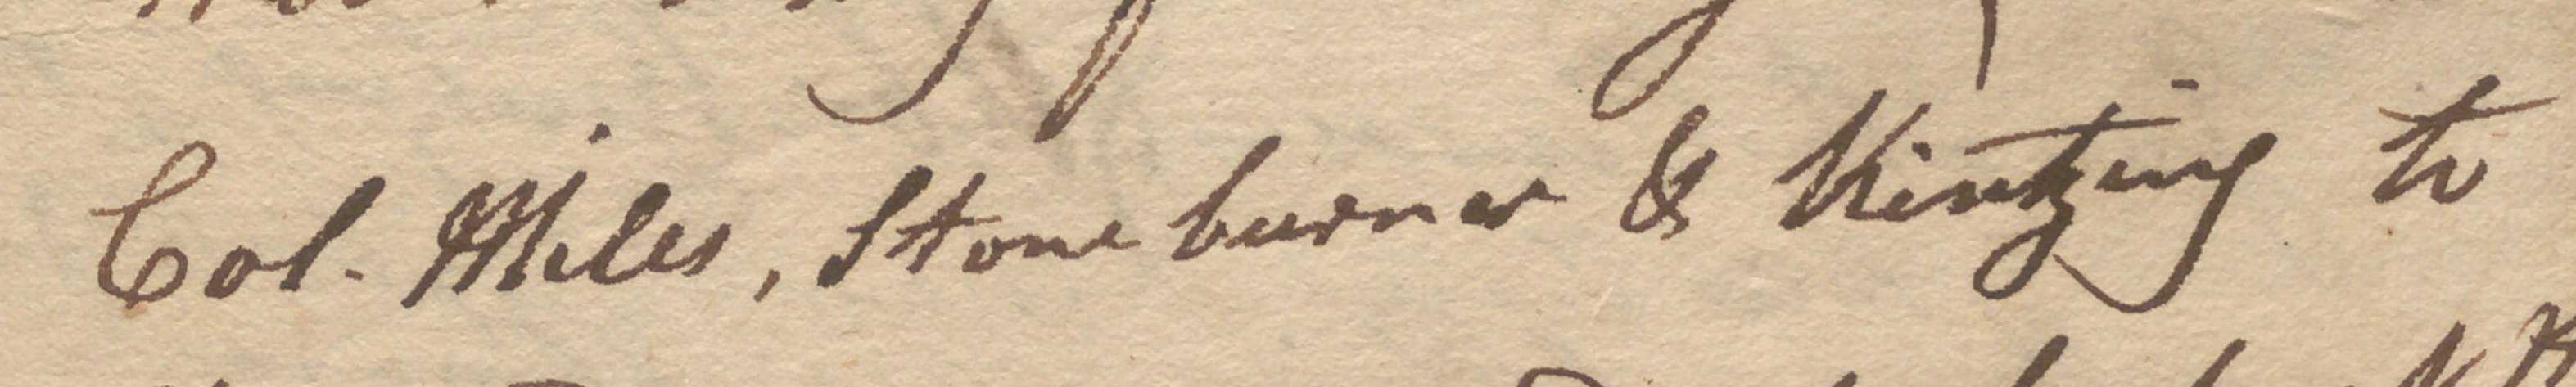Col. Miles, Stoneburner & Kintzing to
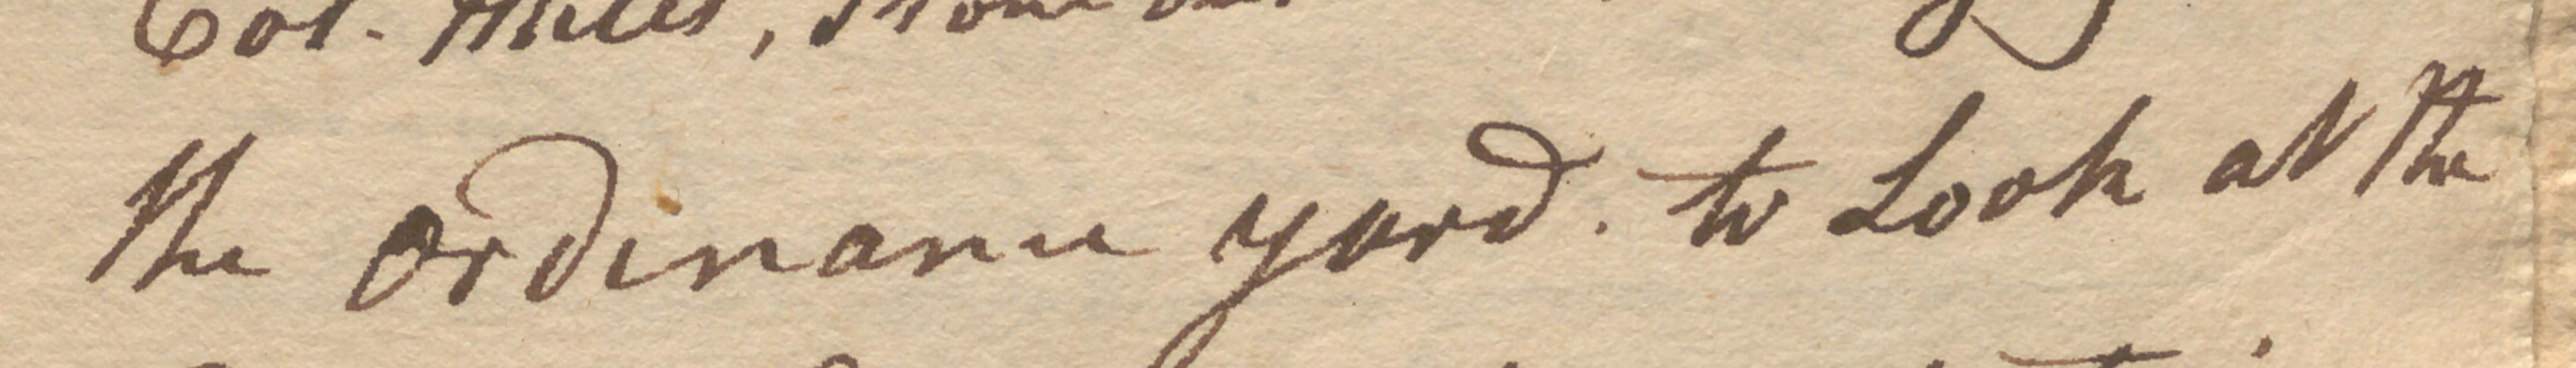the ordinance yard. to Look at the
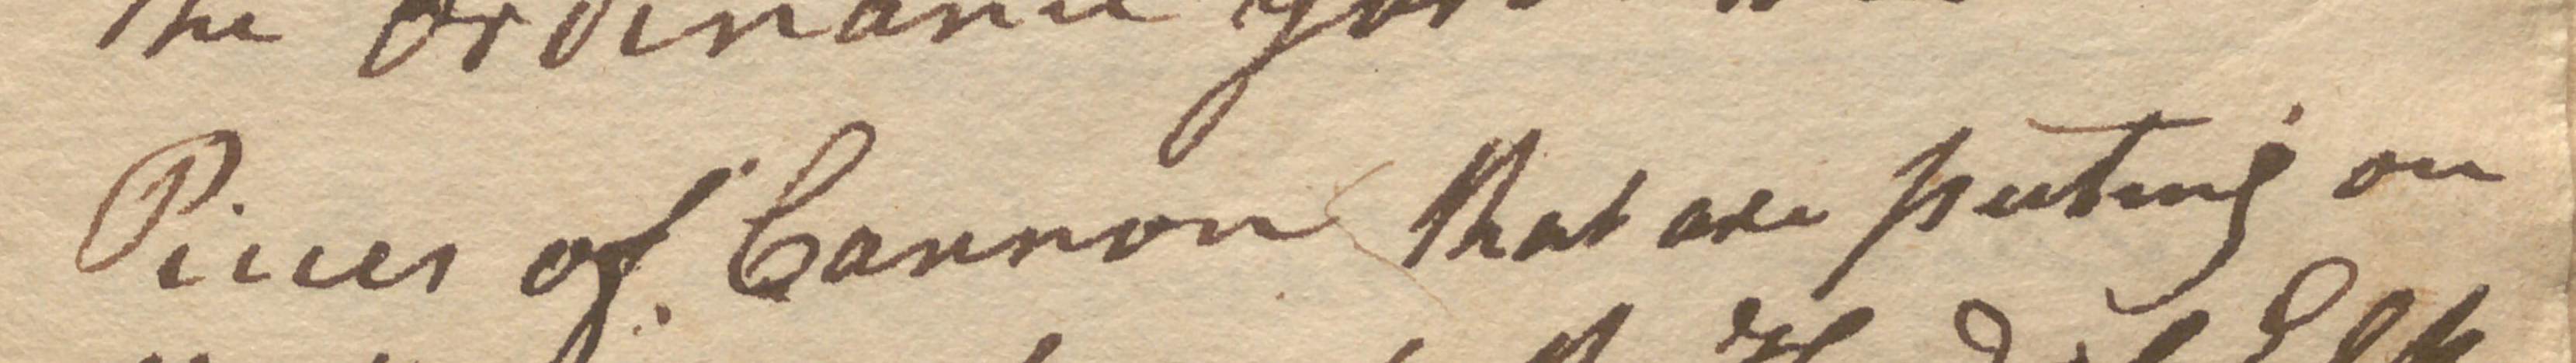Pieces of Cannon that are puting on
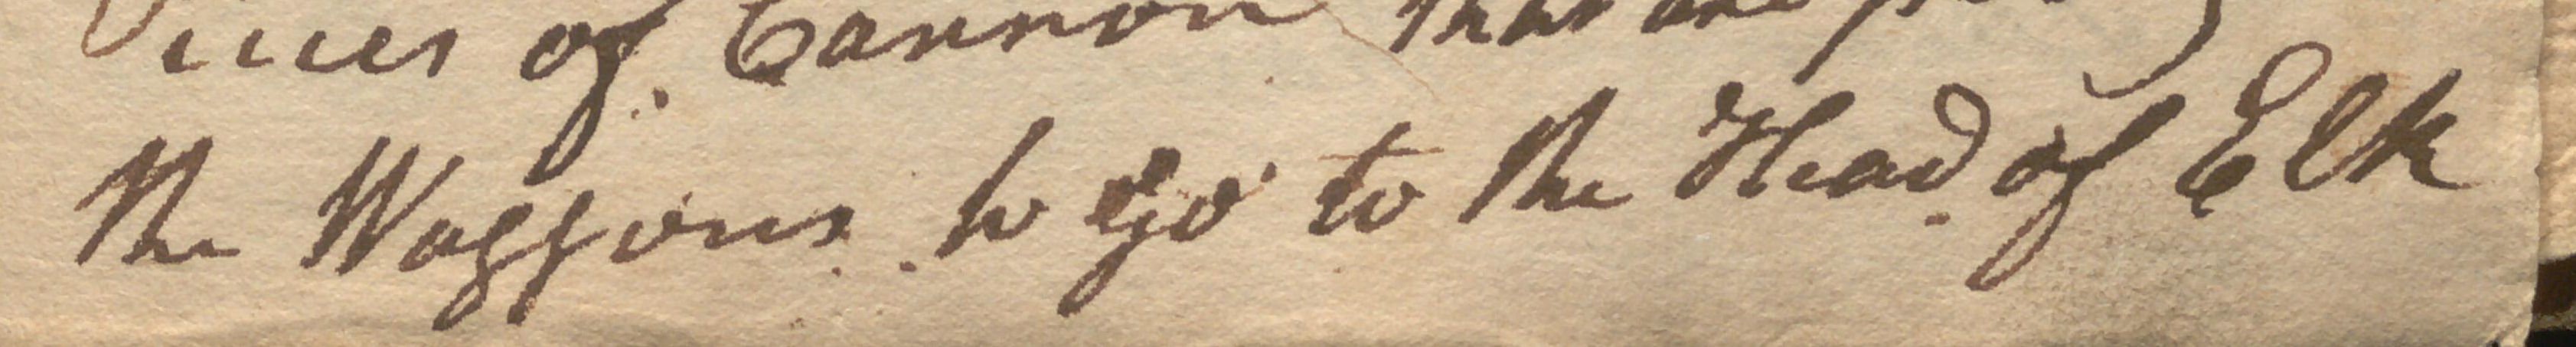the Waggons to go to the Head of Elk
